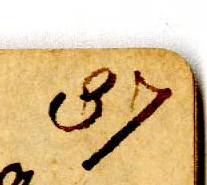37
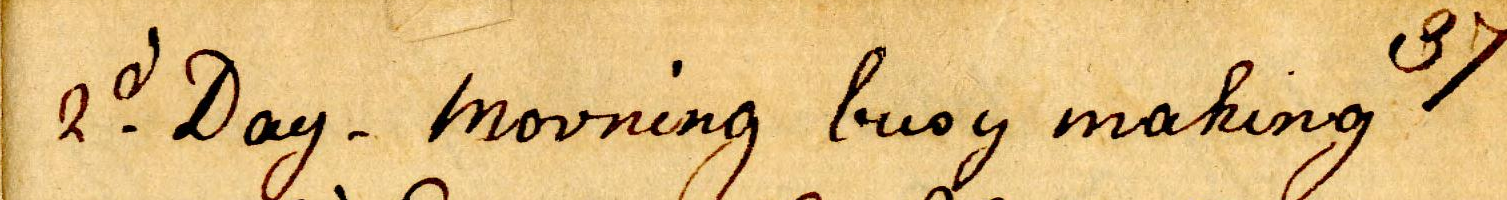2^d Day- morning busy making
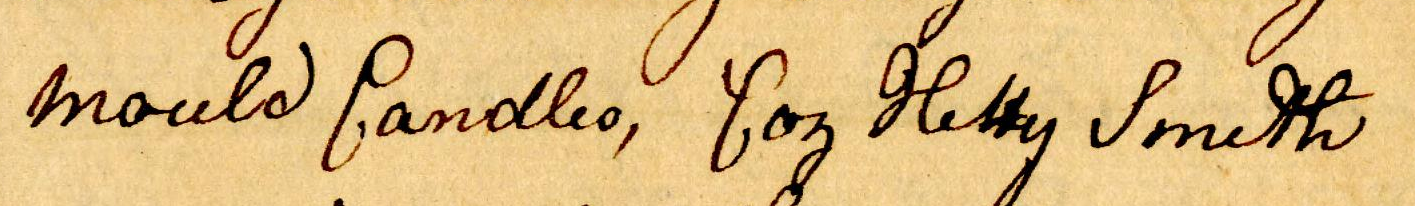mould Candles, Coz Hetty Smith
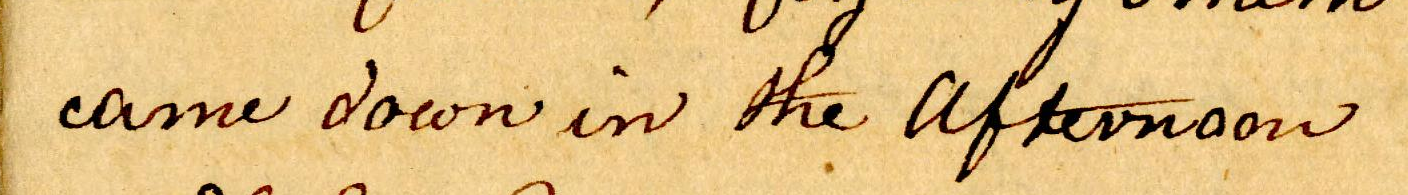came down in the Afternoon
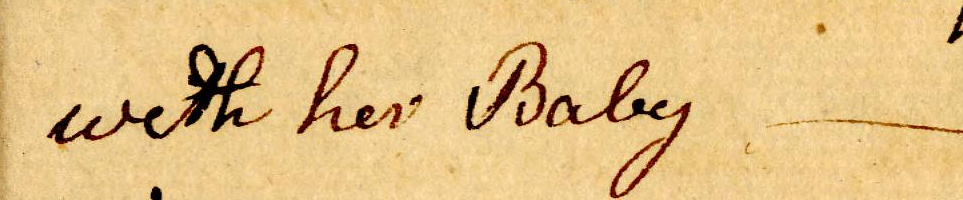weth her Baby-
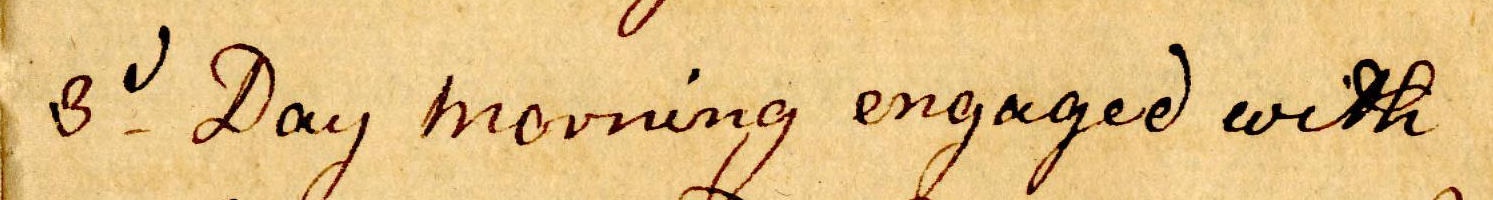3^d Day morning engaged with
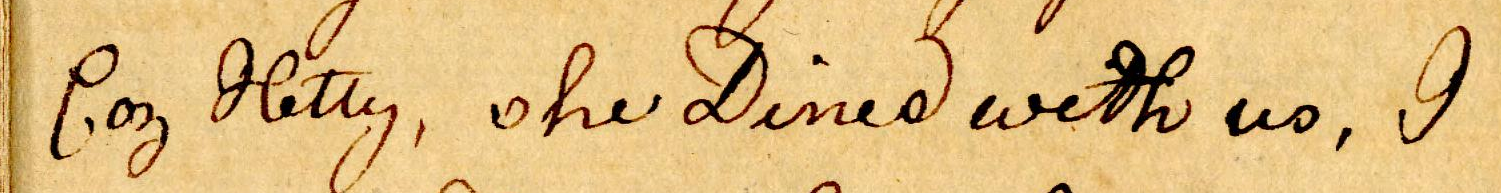Coy Hetty, she Dined with us, I
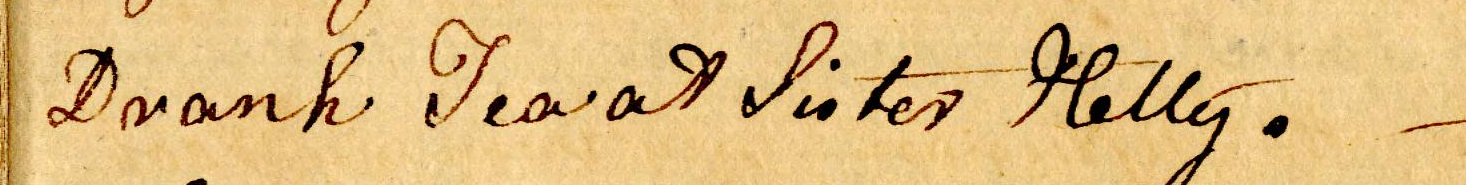Drank Tea at Sister Hettys
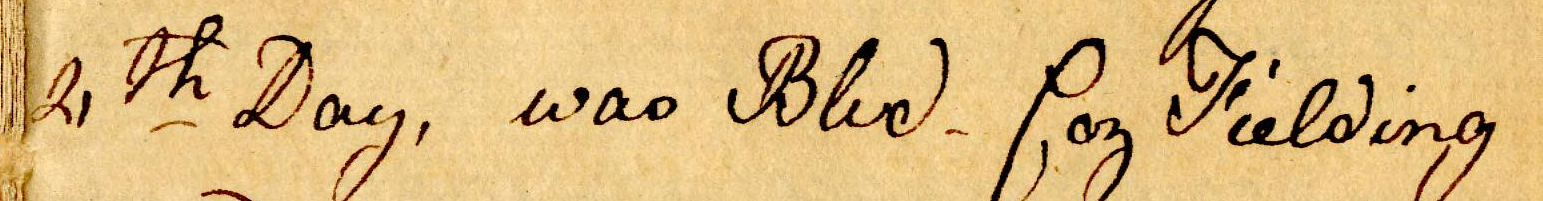4^th Day, was Bled. Coz Fielding
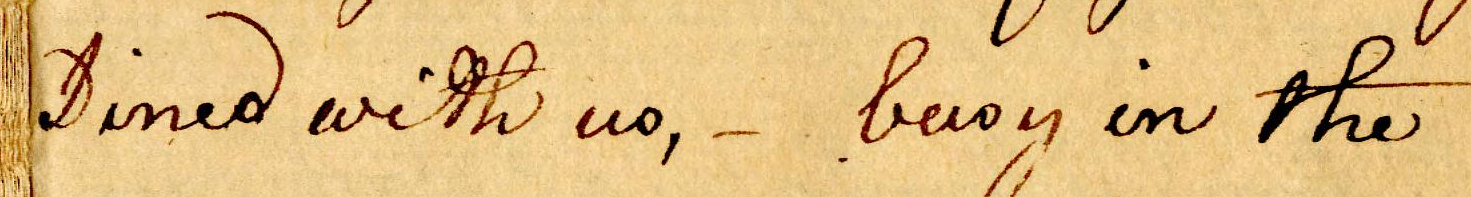Dined with us,- busy in the
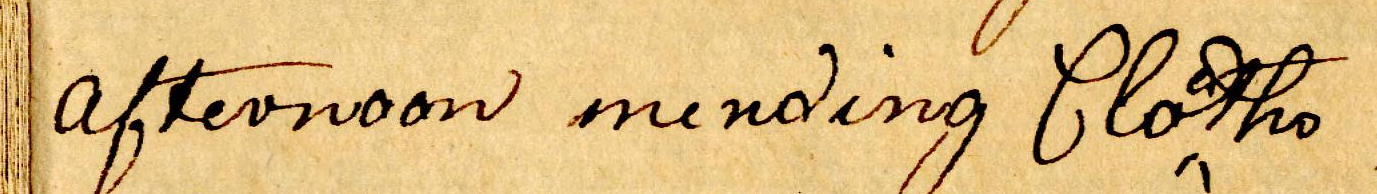Afternoon mending Clo^aths
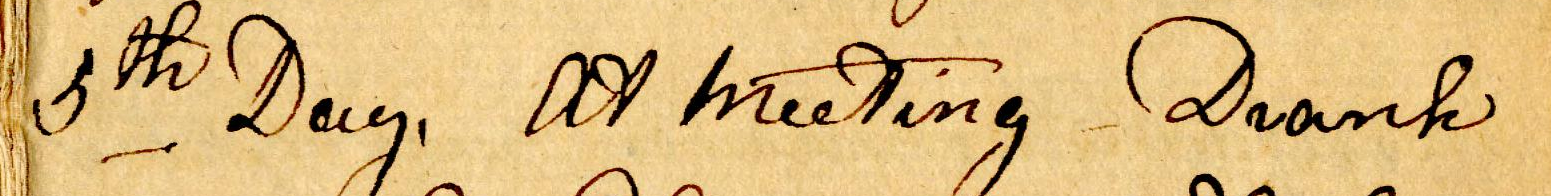5^th Day At Meeting- Drank
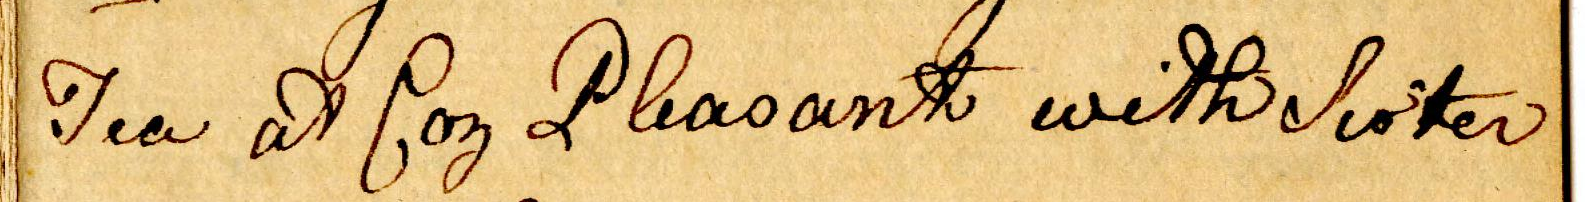Tea at Coz Pleasants with Sister
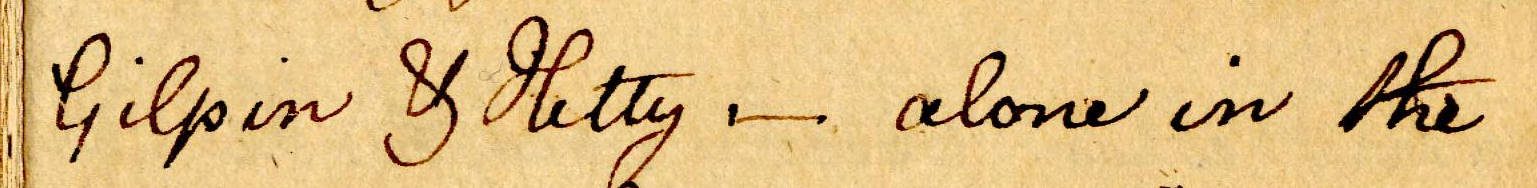Gilpin & Hetty- alone in the
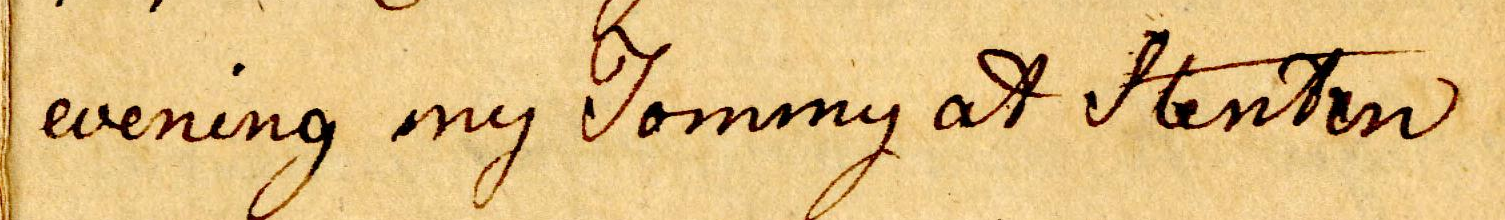evening my Tommy at Stenton
